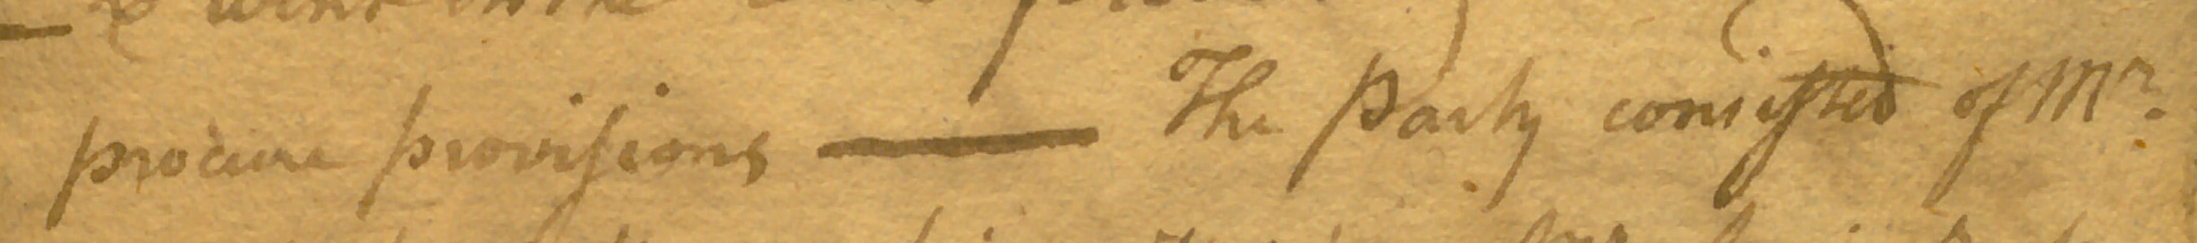procure provisions- The party consisted of M^r.
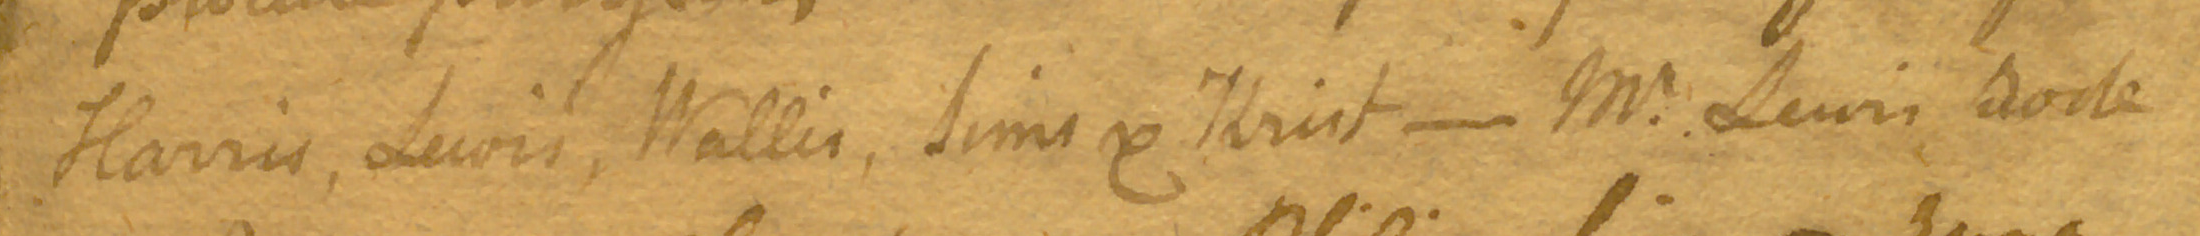Harris, Lewis, Wallis, Sims & Krist- M^r. Lewis rode
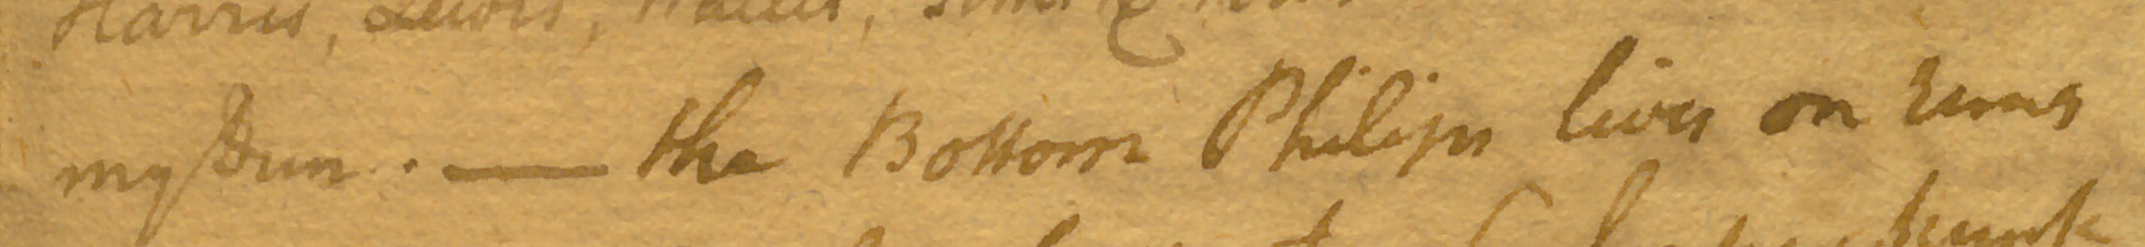my dun.- The Bottom Philips lives on runs
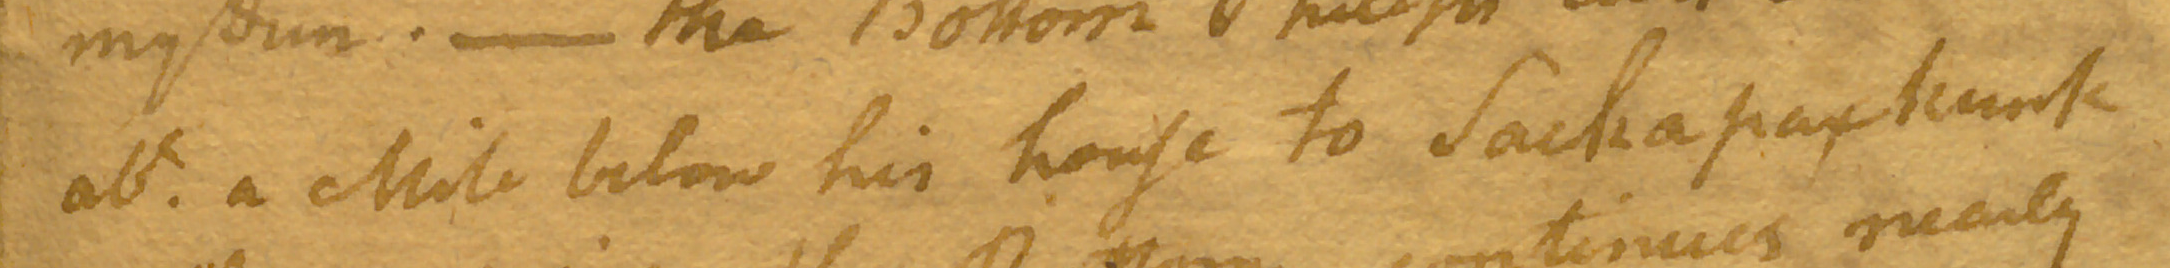ab^t. a Mile below his house to Sackapaxkunk
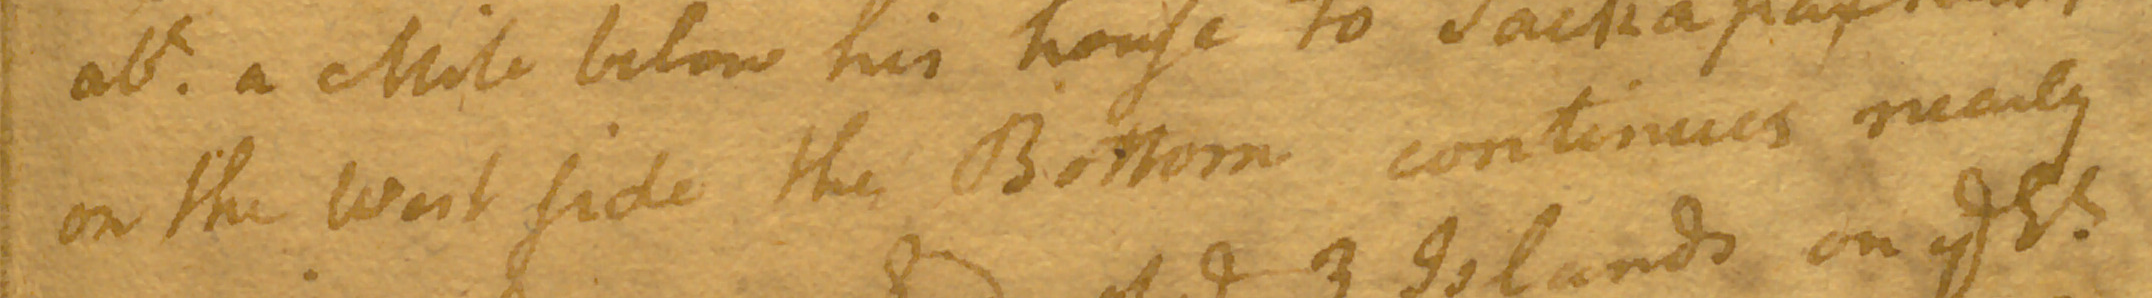on the west side the Bottom continues nearly
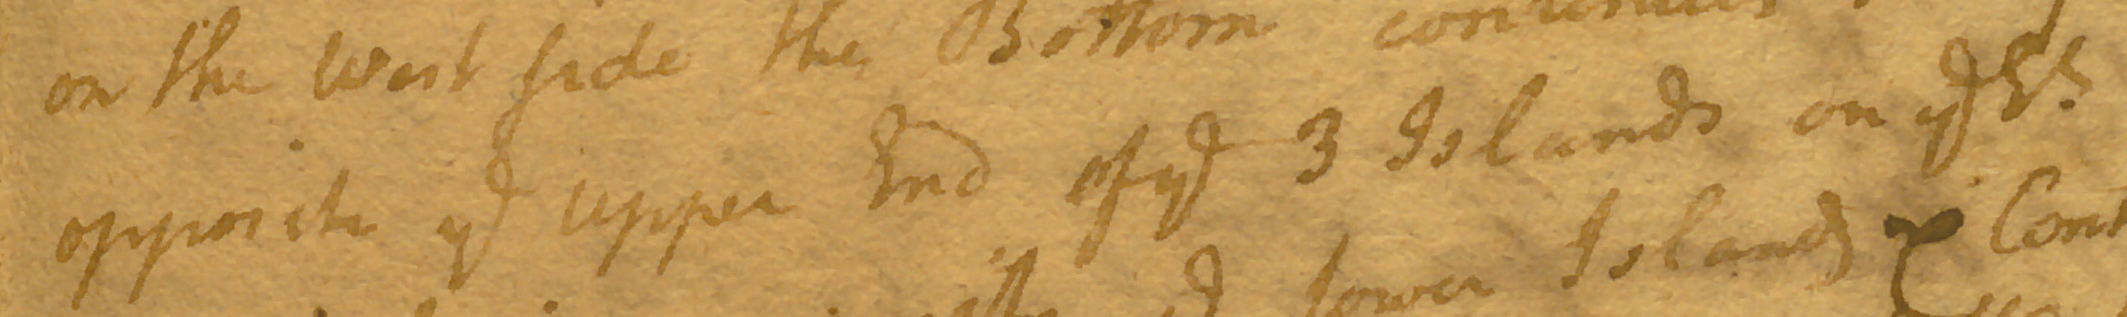opposite y^e upper End of y^e 3 Islands on y^e E^t.
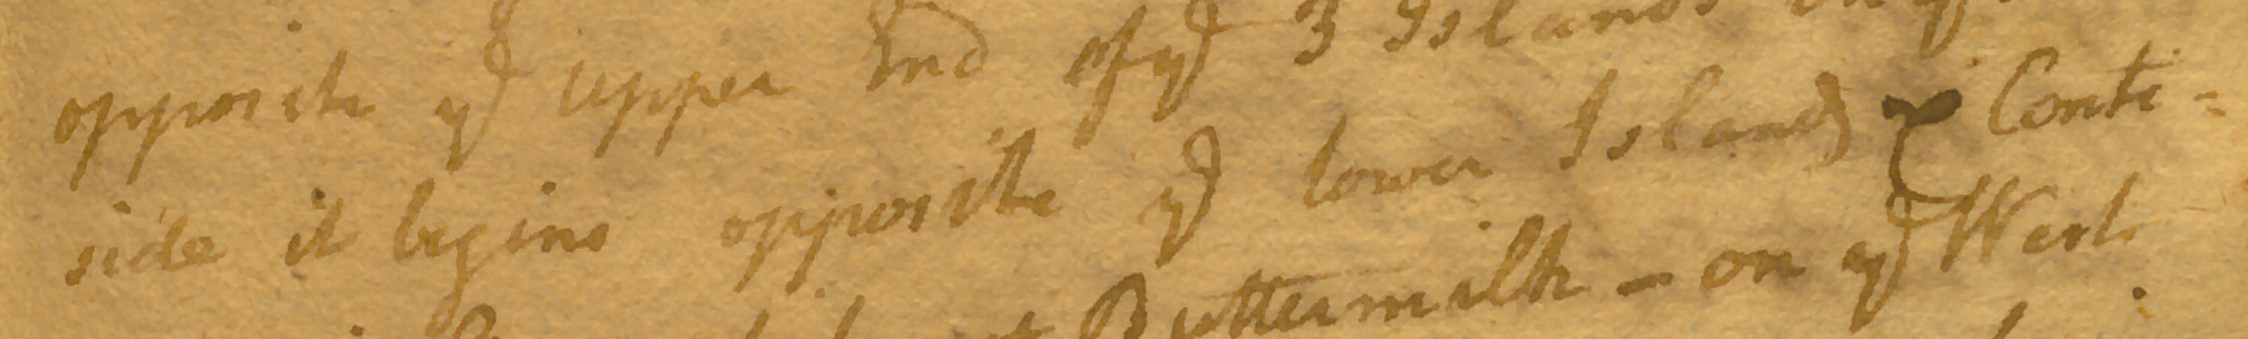side it begins opposite y^e lower Island & Conti-
